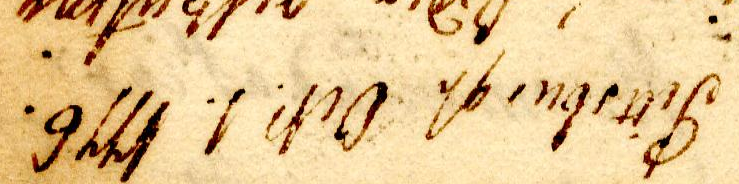Pittsburgh Oct^r. 1. 1776.
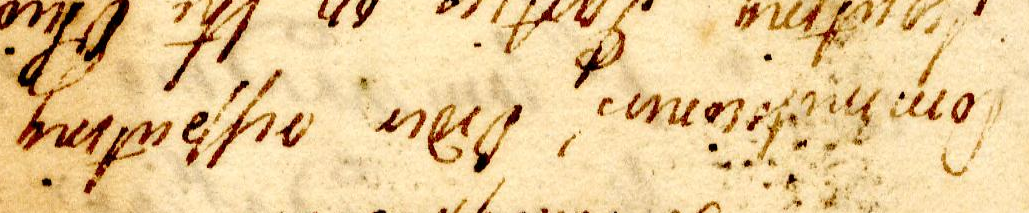Commissioners' Order respecting
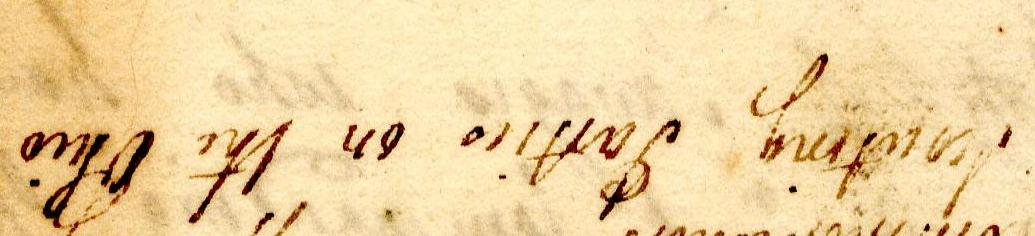Scouting Parties on the Ohio.
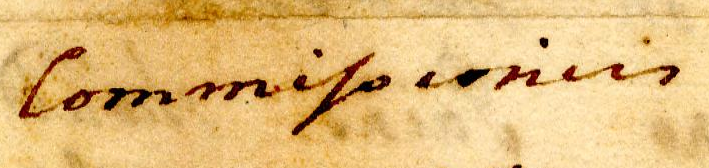Commissioners
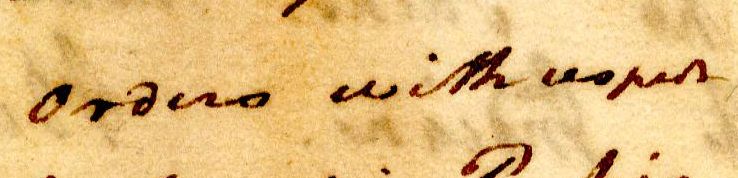orders with respect
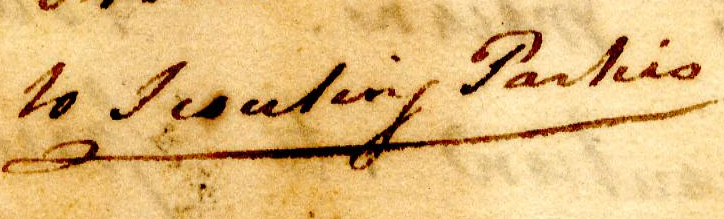to Scouting Parties
